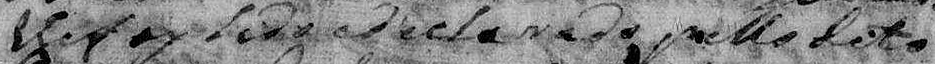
lhe foy lido e declarado pello dito
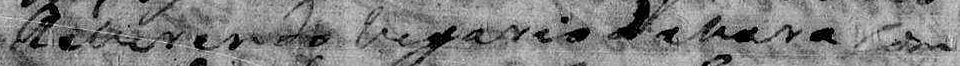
Reverendo Vigario da vara com
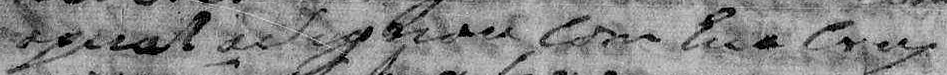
a qual asignou Com hua Crus
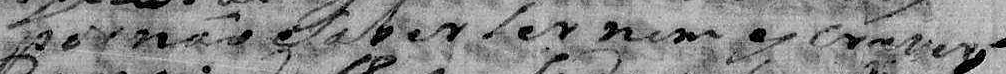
por naõ saber ser nem escrever
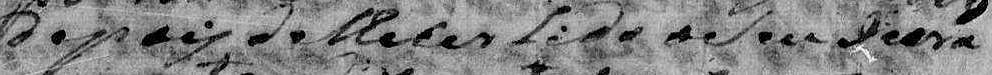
depois de lhe cer lido o seu Iura
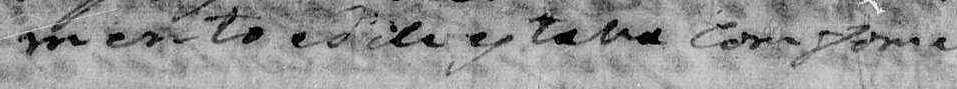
mento e dice estava comfome
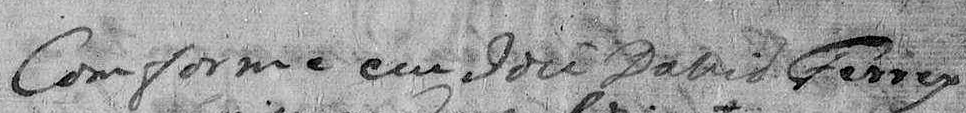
Conforme e eu Ioze David Ferrey
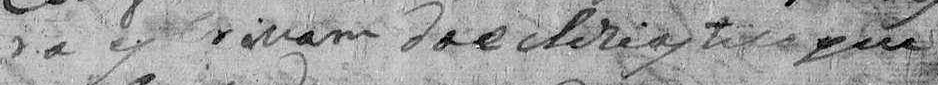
ra esCrivam do ecleziastico que
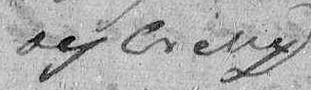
o escreuy
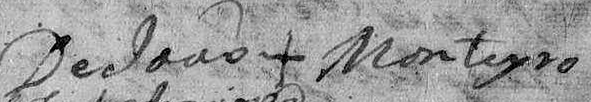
De Ioaõ+ Monteyro
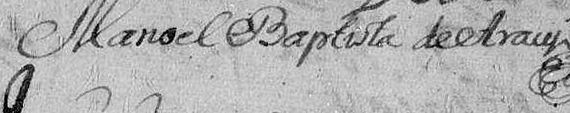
Manoel Baptista de Araujo
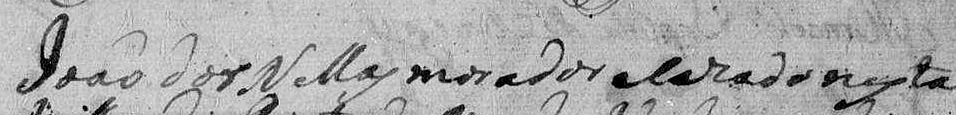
Ioaõ dorNellas morador e Cazado nesta
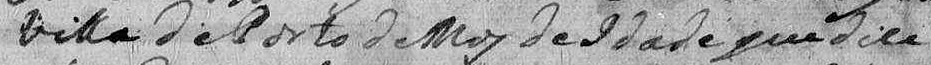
villa de Porto de Mos de Idade que dice
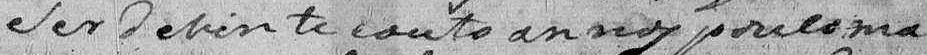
ser de vinte e outo annos pouco ma
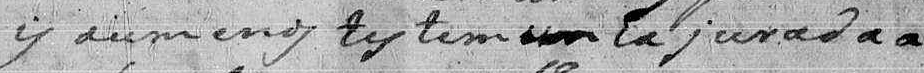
is ou menos testemunha jurada a
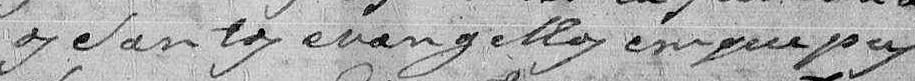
os Santos evangelhos em que pus
